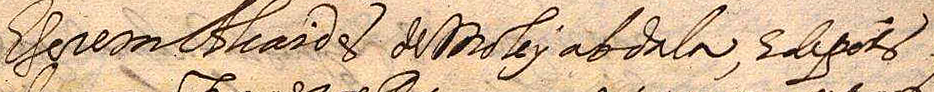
E serem Alcaides de Moley abdala, E depois
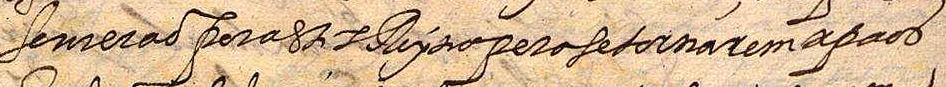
se uieraõ pera estes Reyno pera se tornarem xpaõs
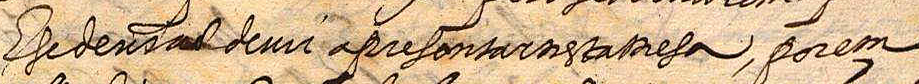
E se deuiaõ de uir apresentar nesta mesa, porem
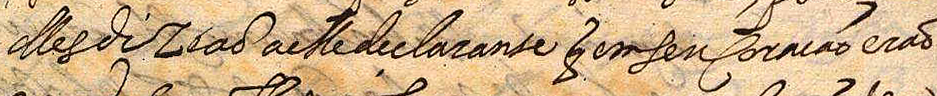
elles diziaõ a elle declarante q̄ em seu Coraçaõ eraõ
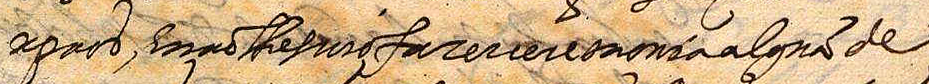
xpaõs, E naõ lhes uio fazer ceremonia alguā de
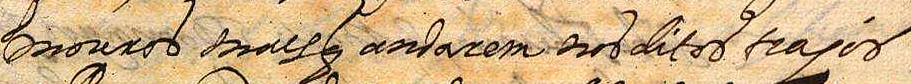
mouros mais q̄ andarem nos ditos trajos
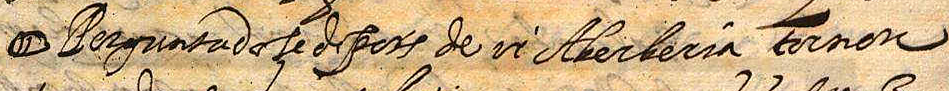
⁋ Perguntado se dipois de ir A berberia tornou
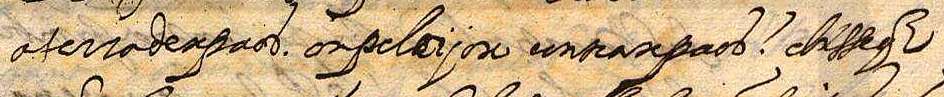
a terra de xpaõs ou peleijou contra xpaõs? disse q̄
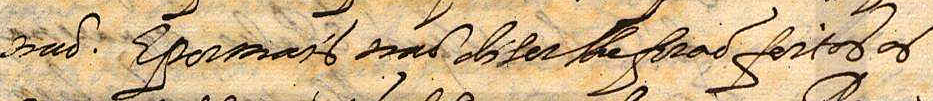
naõ. E por mais naõ diser lhe foraõ feitas as
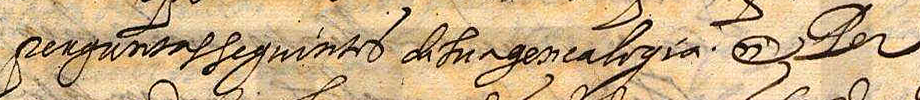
perguntas seguintes de sua genealogia. ⁋ Per
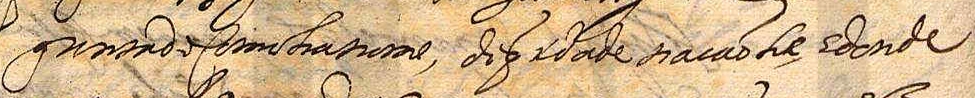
guntado Como ha nome, de q̄ idade naçaõ he, E donde
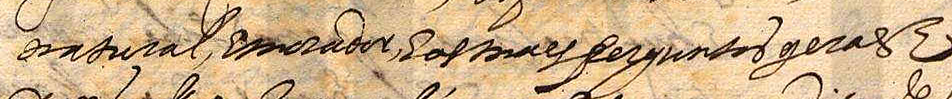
natural, E morador, E as maes perguntas geraes
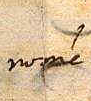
nome
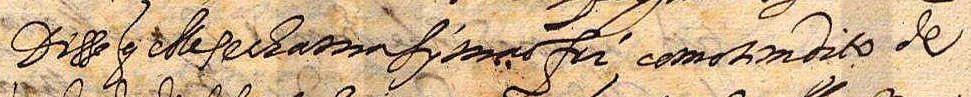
Disse q̄ elle se chama symão frz̄ como tem dito de
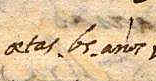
ætas 65. an̄os.
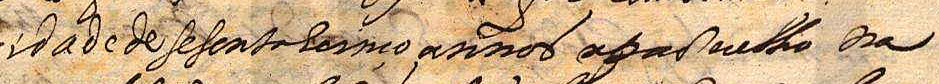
idade de sesenta E cinco annos xpaõ uelho na
